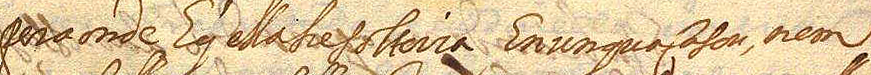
pera onde E q̄ ella he solteira E nunqua Casou, nem
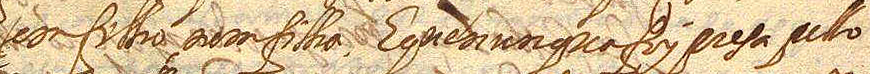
tem filho, nem filha. E que nunqua foy presa pello
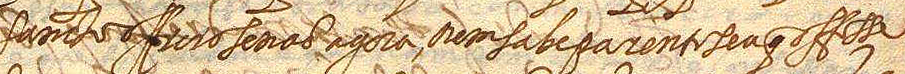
sancto officio senaõ agora, nem sabe parente seu q̄ o ffosse
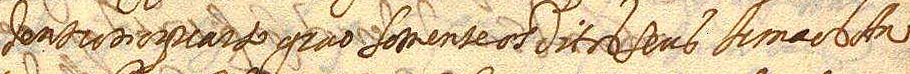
dentro no quarto grao somente os ditos seus Irmaõs An
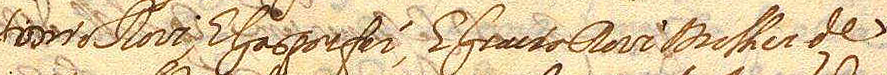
tonio Roiz, E Gaspar frz̄, E Gracia Roiz Molher de
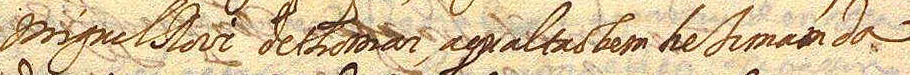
miguel Roiz de thomar, a qual taõbem he Irmãm da
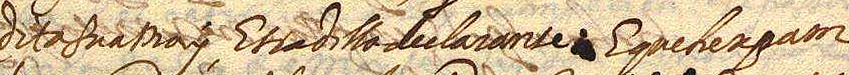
dita sua may, E tia della declarante E que he xpam
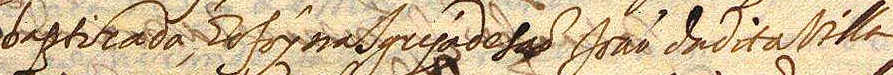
baptizada, E o foy na Igreja de saõ Joaõ da dita Villa
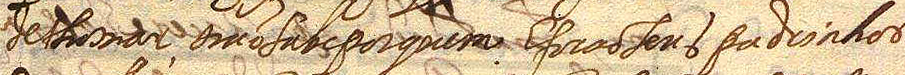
de thomar, naõ sabe por quem. E foraõ seus padrinhos
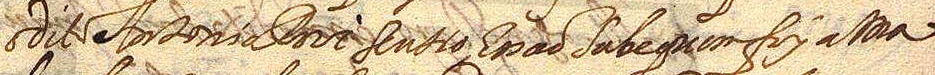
o dito Antonio Roiz seu tio, E naõ sabe quem foy a Ma
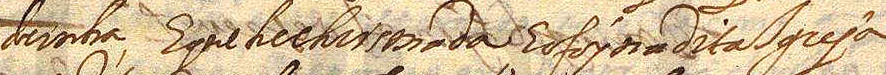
drinha, E que he chrismada, E o foy na dita Igreja
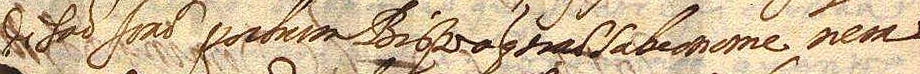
de Saõ Joaõ por hum Bispo a q̄ naõ sabe o nome, nem
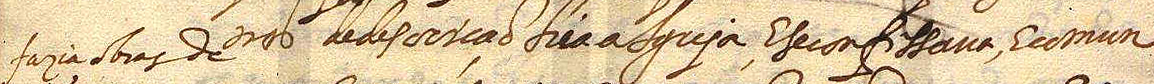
nos de deserçaõ hia a Igreja, E se confessaua, E comun
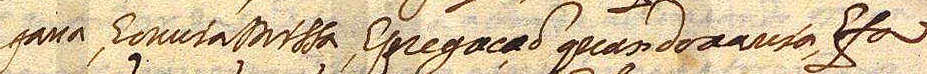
gaua, E ouuia missa, E pregaçaõ quando a auia, E fa
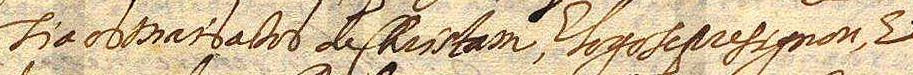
zia os mais actos de Christam, E logo se presignou, E
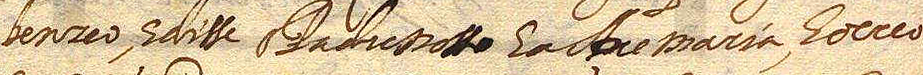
benzeo, E disse o Padre nosso E a Aue maria, E o creo
